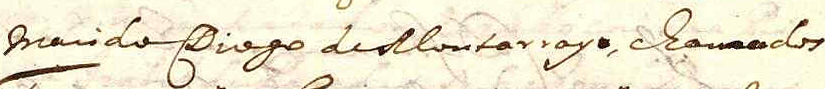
marido Diogo de Montarroyo, chamados
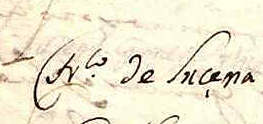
Fr.co de Lucena
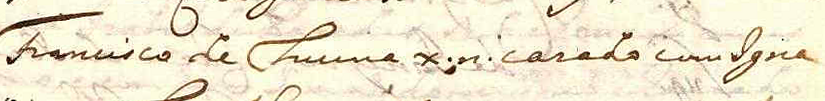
Francisco de Lucena x. n. cazado com Igna
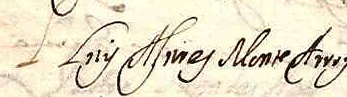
.L. Luis Alures Monte Arroyo
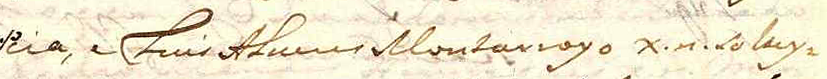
cia, e Luis Alueres Montarroyo x. n. soltey
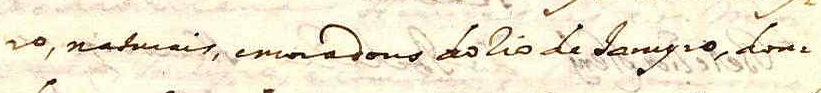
ro, naturais, e moradores do Rio de Ianeyro, don
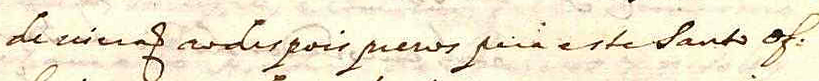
de uiuaõ ao despois prezos pera este Santo of
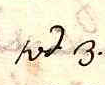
tod 3.
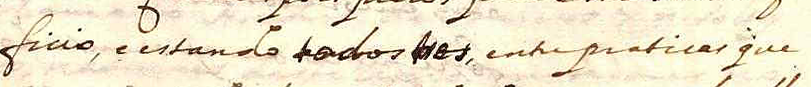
ficio, e estando todos tres, entre praticas que
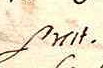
prat.
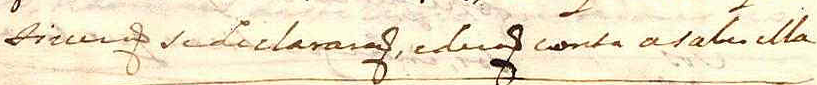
tiuerõ se declararaõ, e deraõ conta a saber ella
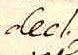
decl.
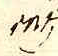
int̄
